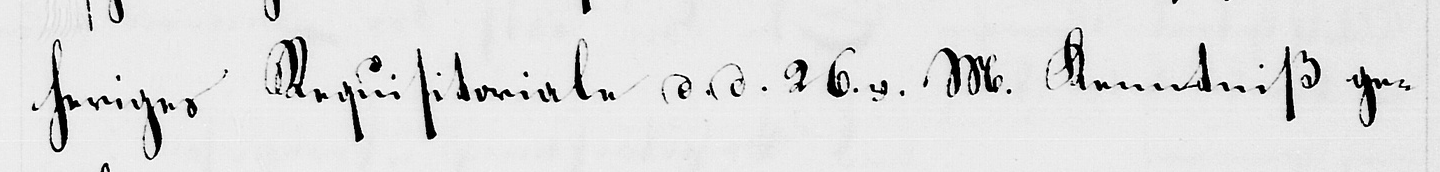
heriges Requisitorale d. d. 26. v. M. Kenntniß ge¬
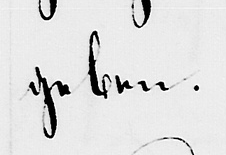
geben.
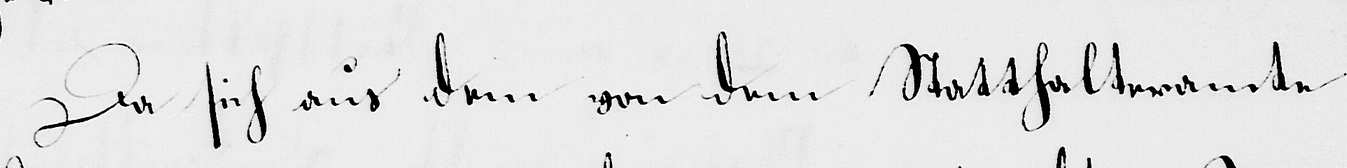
Da sich aus dem von dem Statthalteramte
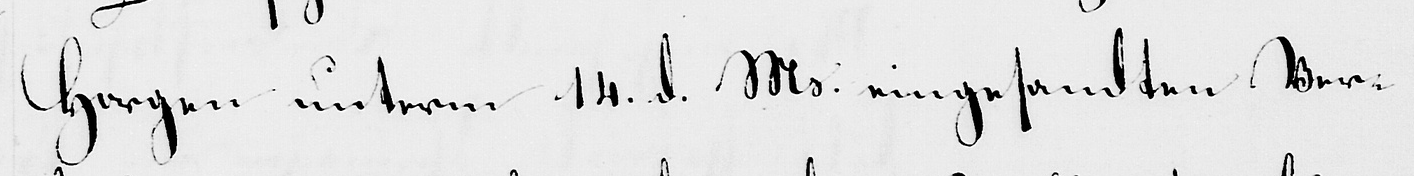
Horgen unterm 14. d. Ms. eingesandten Ver¬
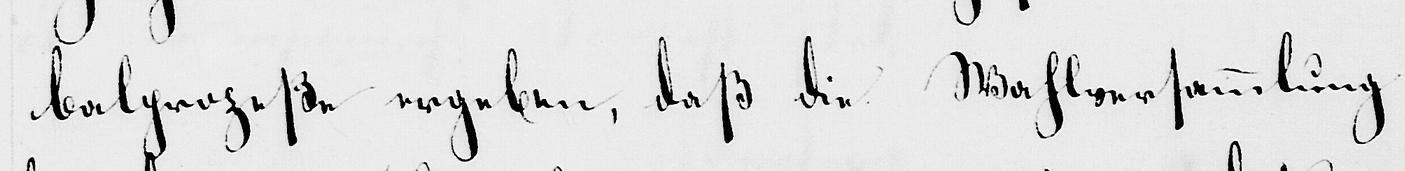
balprozeße ergeben, daß die Wahlversammlung
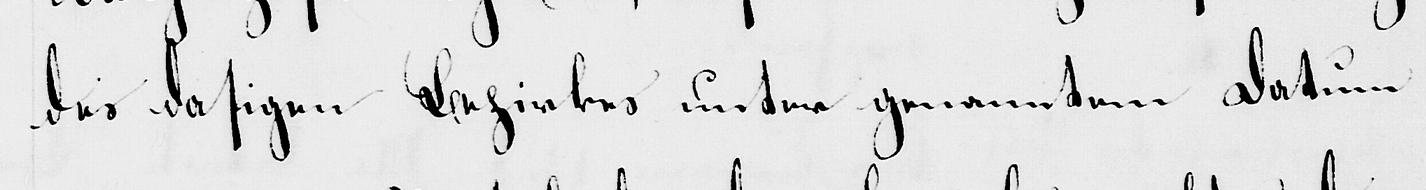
des dasigen Bezirkes unter genanntem Datum
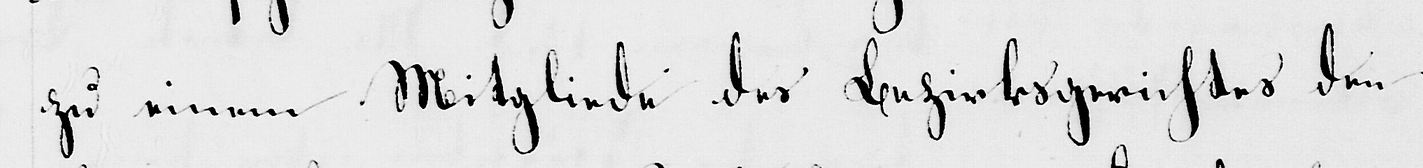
zu einem Mitgliede des Bezirksgerichtes den
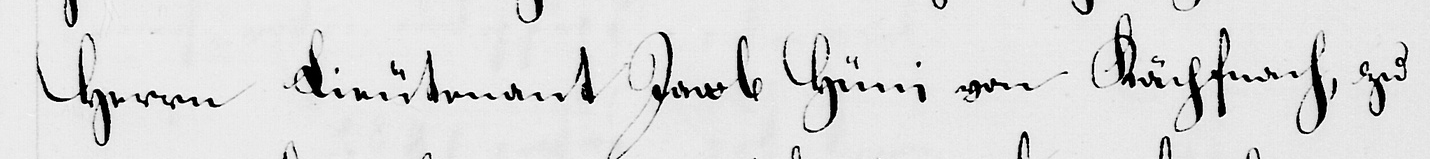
Herrn Lieutenant Jacob Hüni von Käpfnach, zu
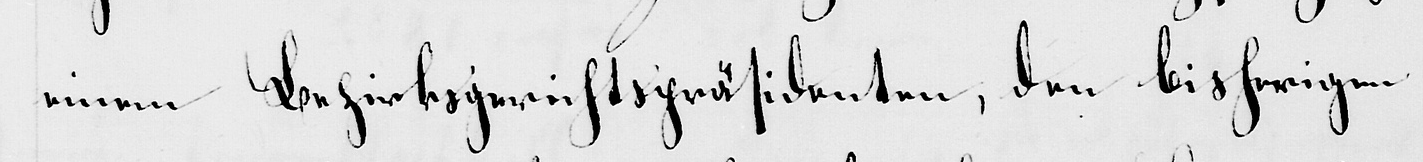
einem Bezirksgerichtspräsidenten, den bisherigen
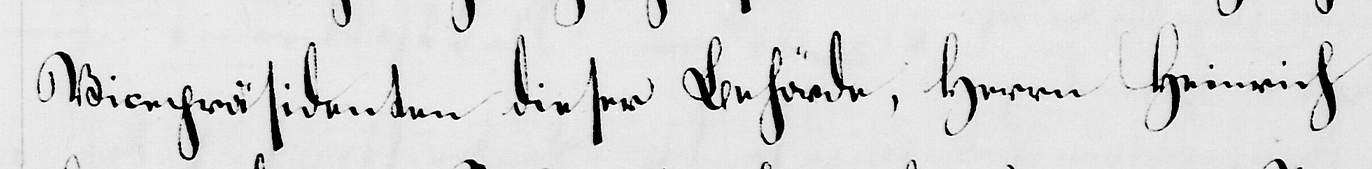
Vicepräsidenten dieser Behörde, Herrn Heinrich
